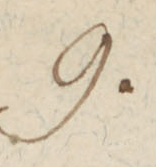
9.
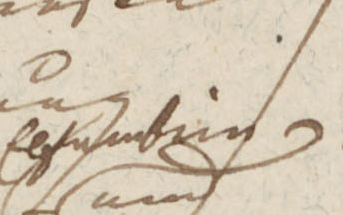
That kein
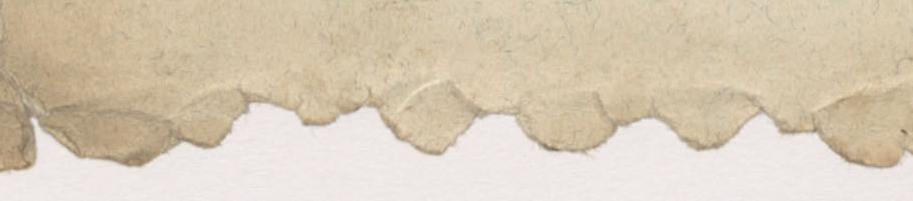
gleich in der Aufführung
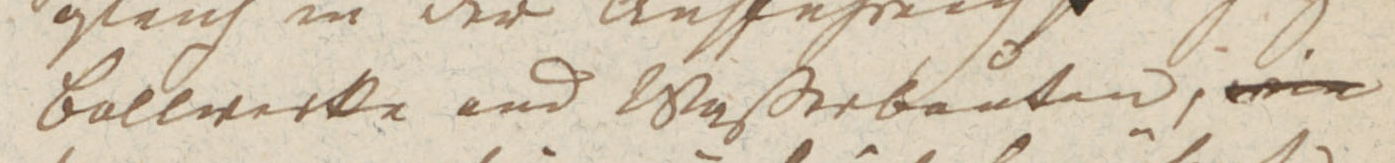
Bollwerke und Wasserbauten, wie
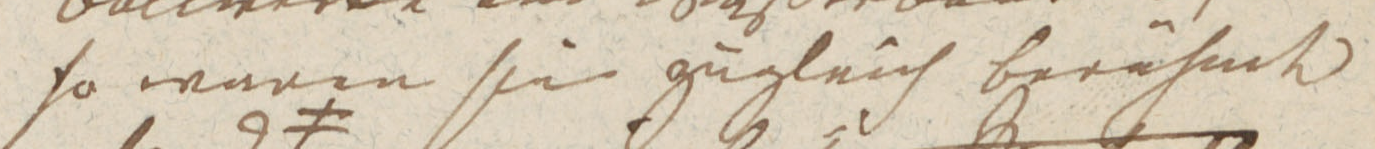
so waren sie zugleich berühmt
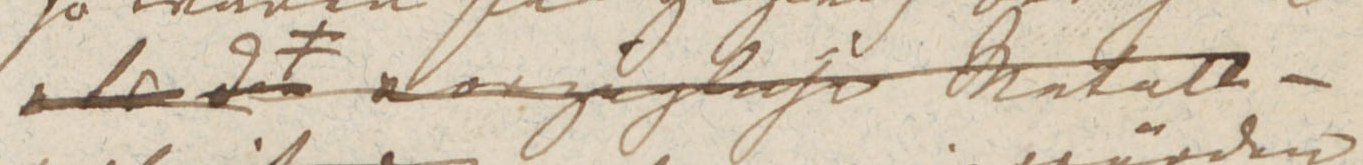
als der % vorzügliche Metall-
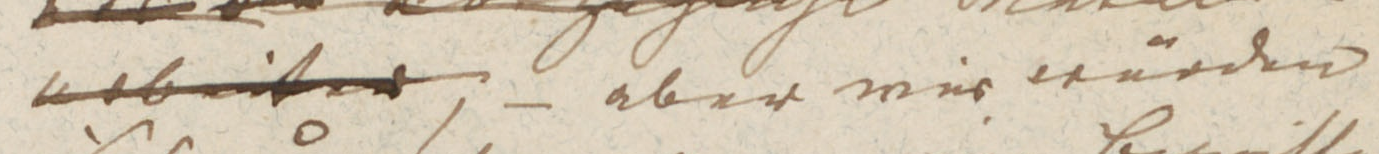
arbeiter, – aber wir würden
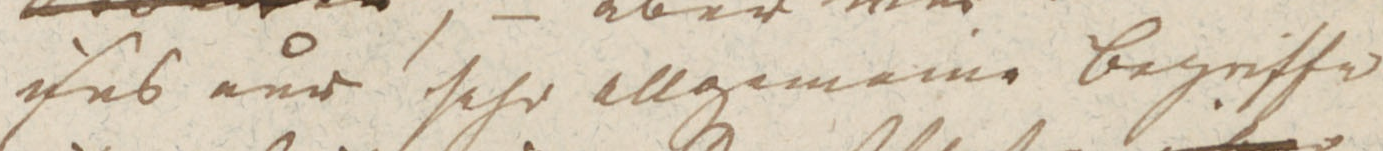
uns nur sehr allgemeine Begriffe
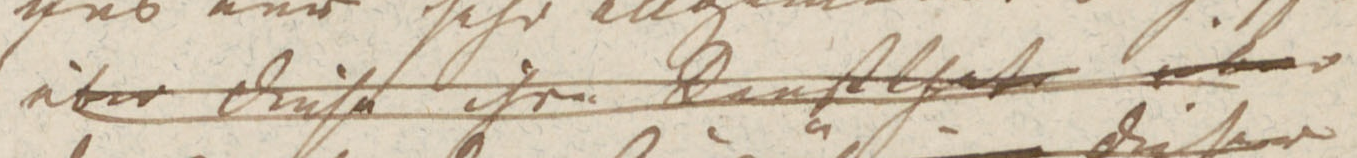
über diese ihre Kunstthat über
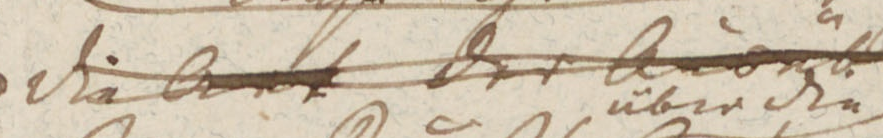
die Art der Ausübung dieser
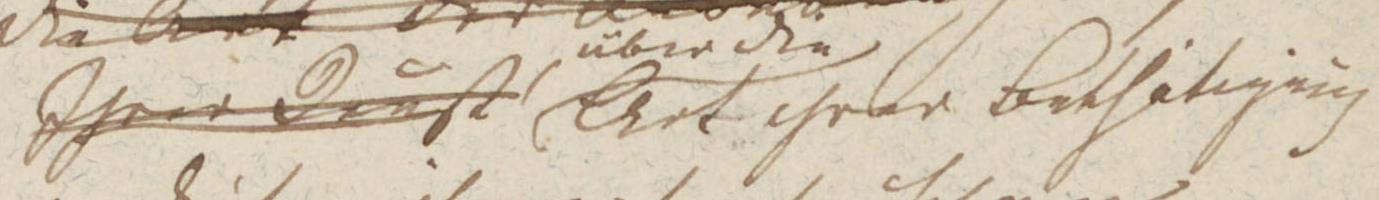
Ihrer Kunst über die Art ihrer Bethätigung
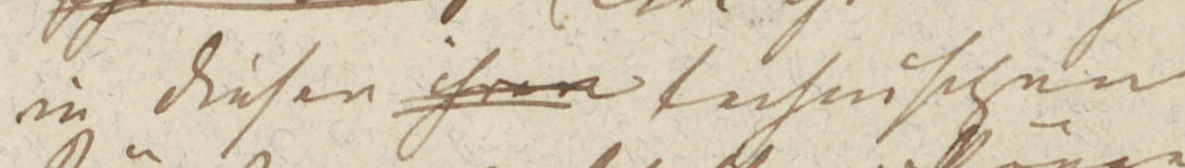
in diesen ihren technischen
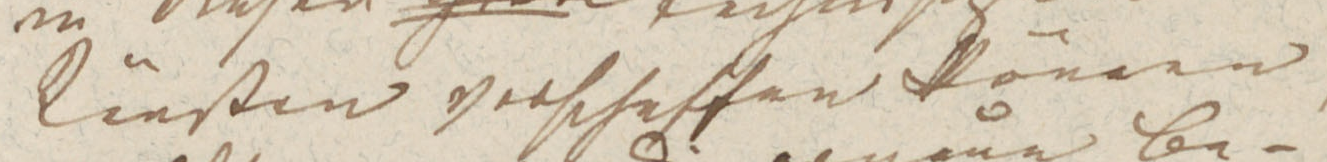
Künsten verschaffen können,
